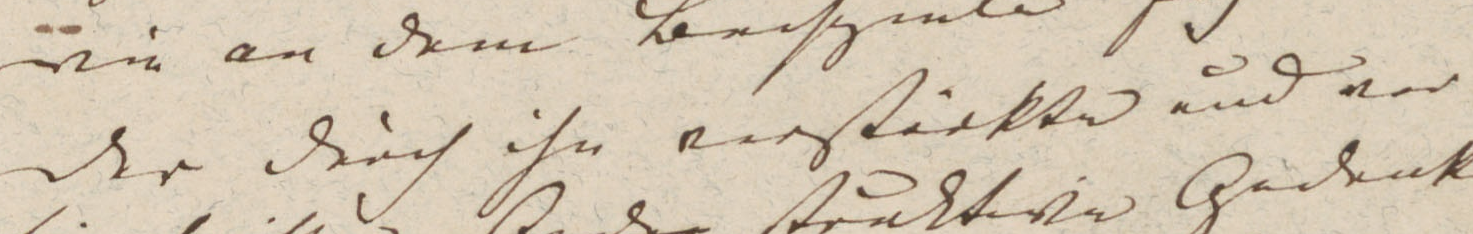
Der durch ihn verstärkte und ver-
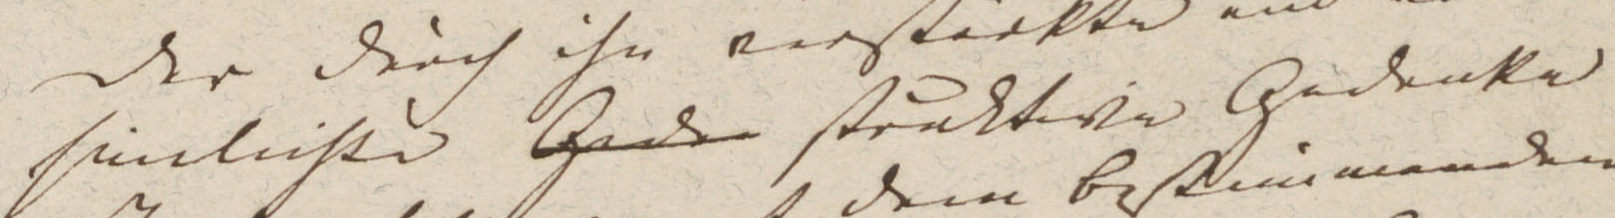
sinnlichte Geda struktive Gedanke
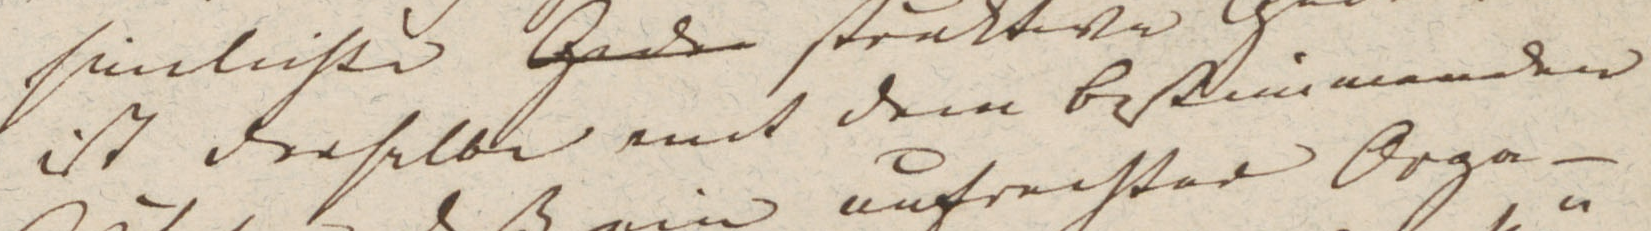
ist derselbe mit dem bestimmenden
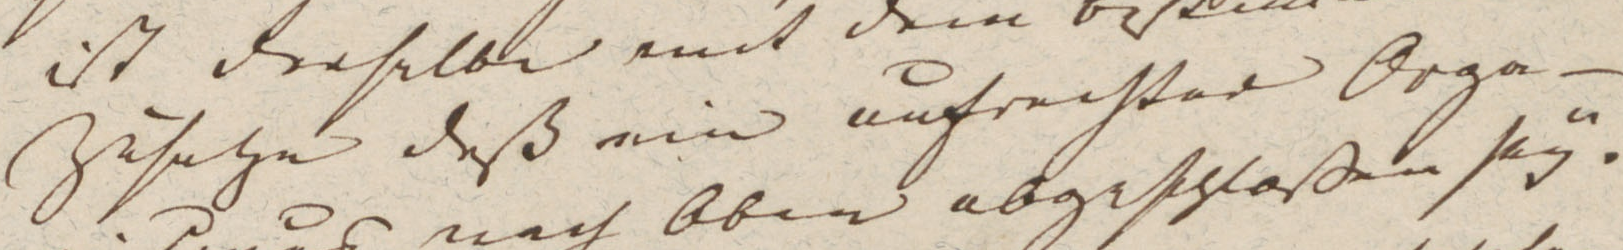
Zusatze dass ein aufrechter Orga-
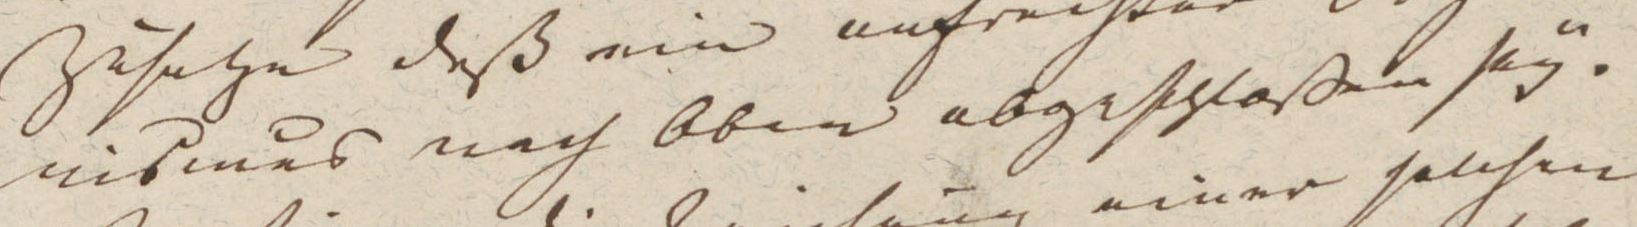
nismus nach Oben abgeschlossen sey.
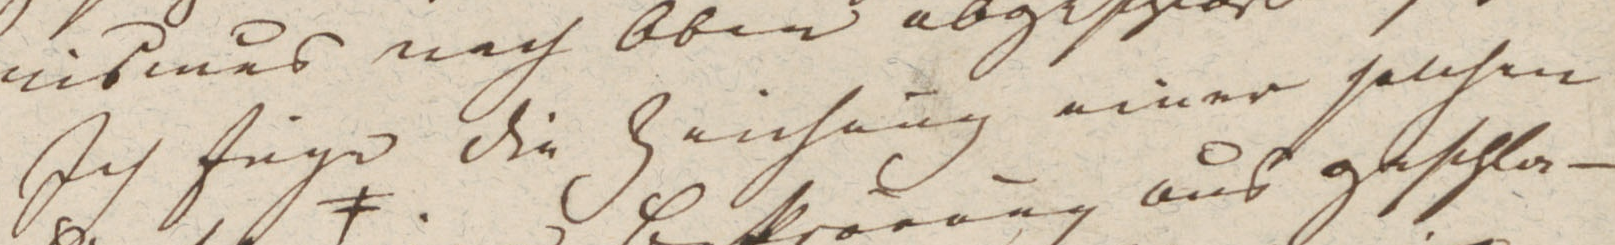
Ich füge die Zeichnung einer solchen
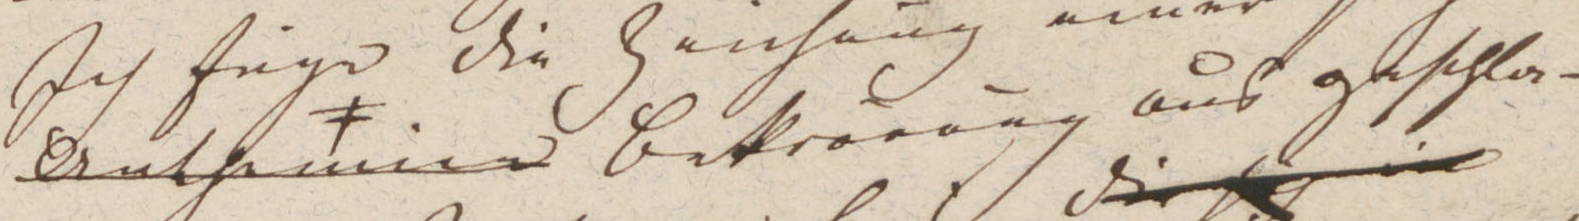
Anthemien% Bekrönung aus geschla-
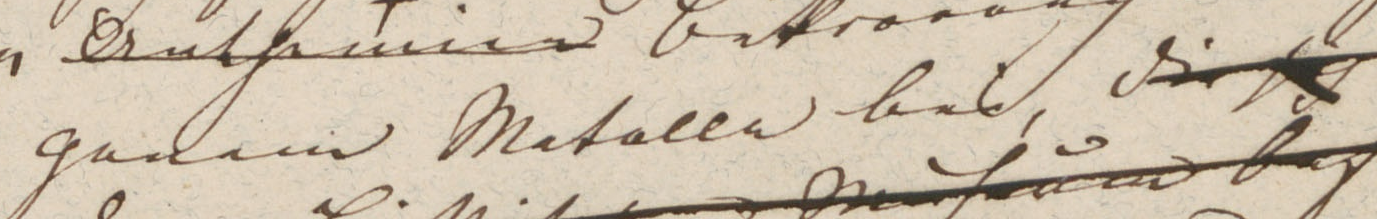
genem Metalle bei, die sich in
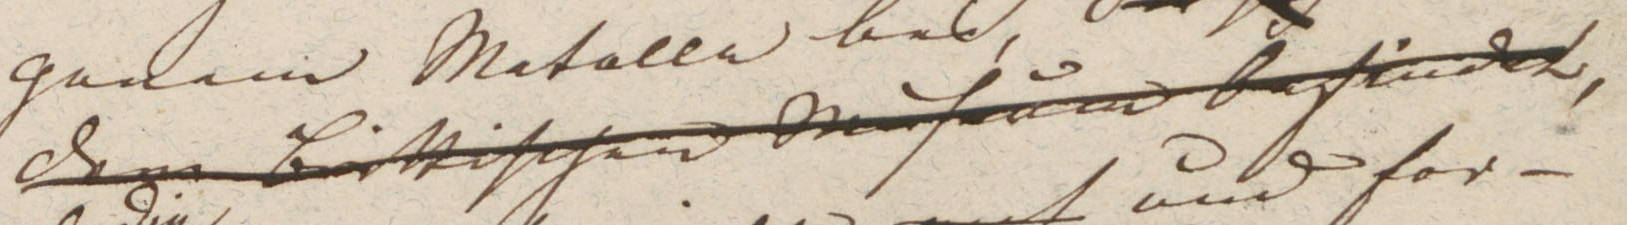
dem Brittischen Museum befindet,
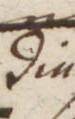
die
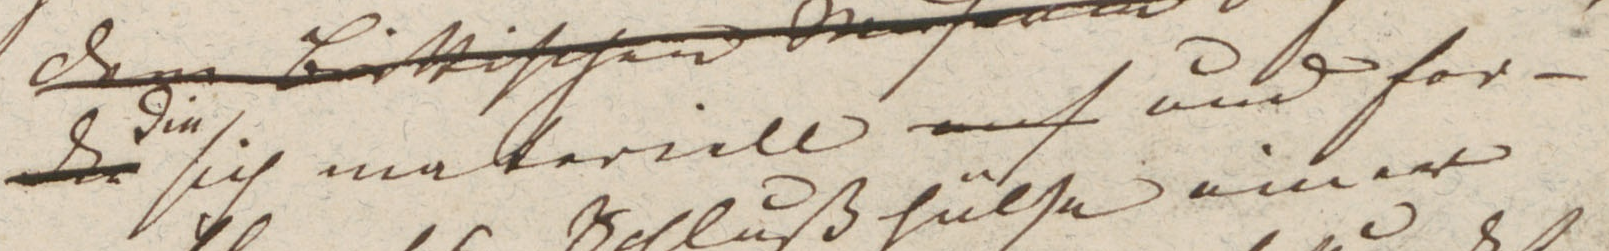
die sich materiell aus und for-
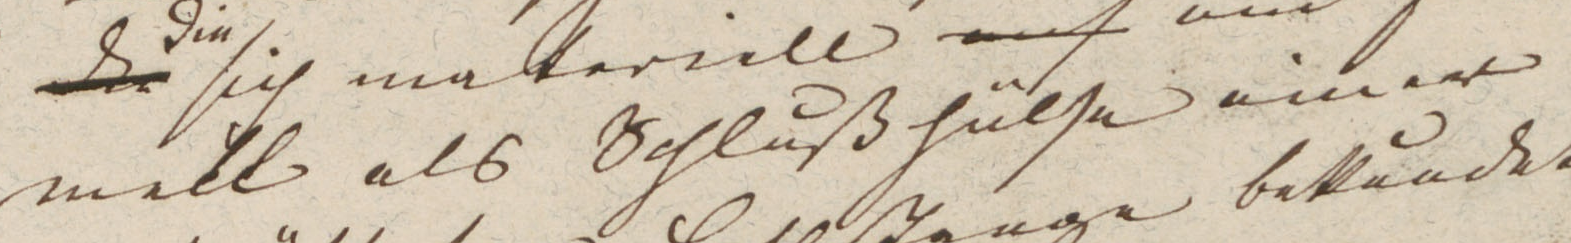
mell als Schlusshülse einer
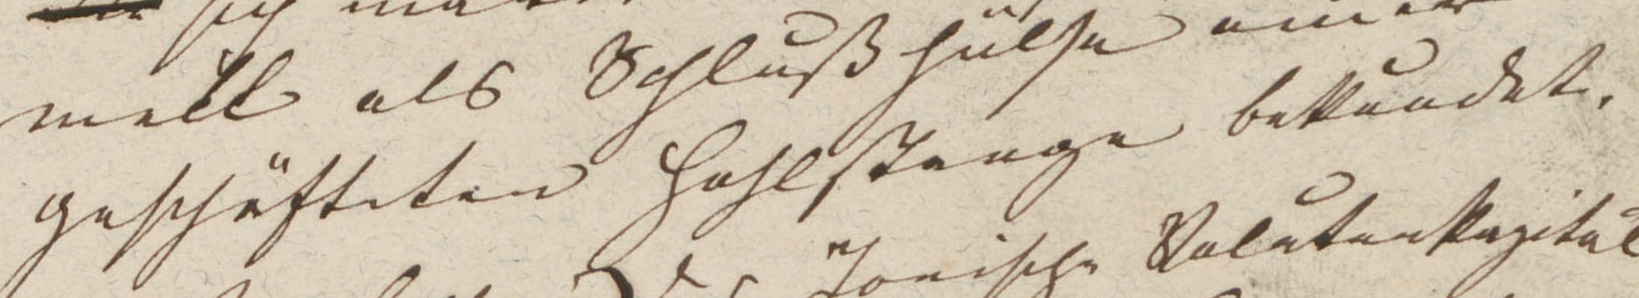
geschäfteten Hohlstange bekundet.
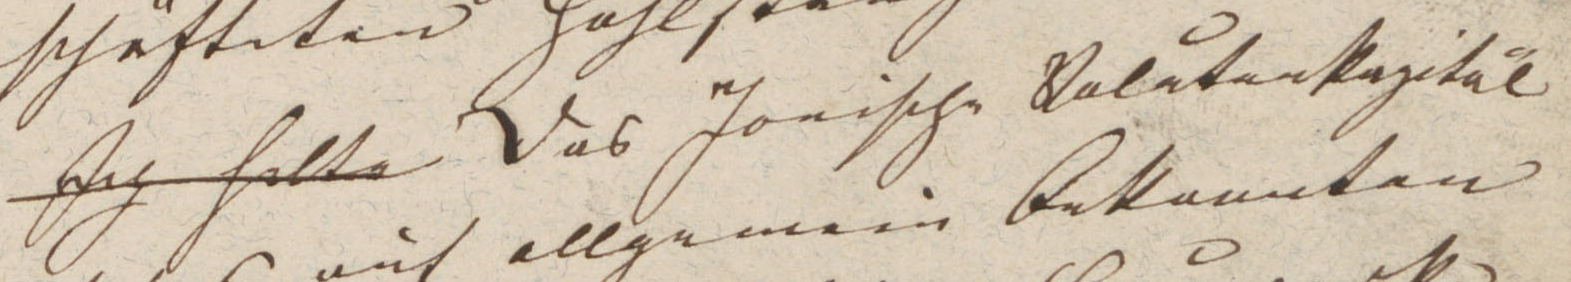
Ich halte dDas Ionische Volutenkapitäl
